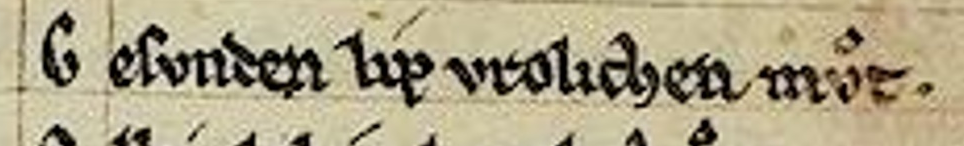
Geſvnden lip vrolichen mv°ot.
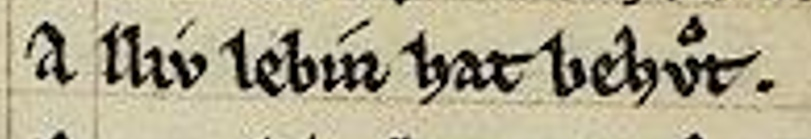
Alliv lebin hat behv°ot.
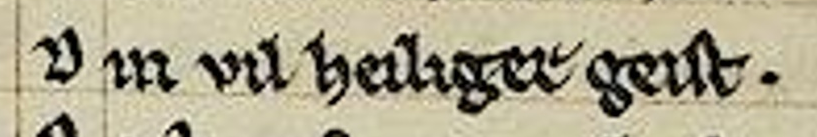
Din vil heiliger geiſt.
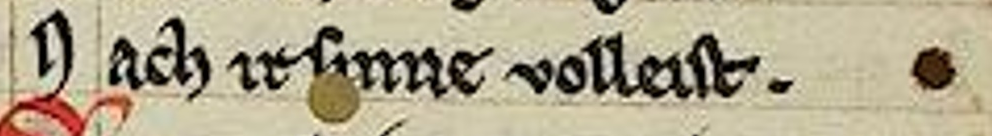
Nach ir ſinne volleiſt.
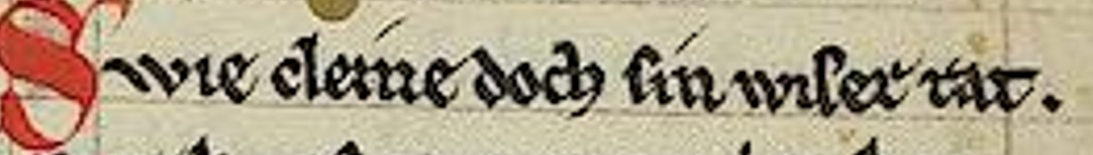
*Swie cleine doch ſin wiſer rat.
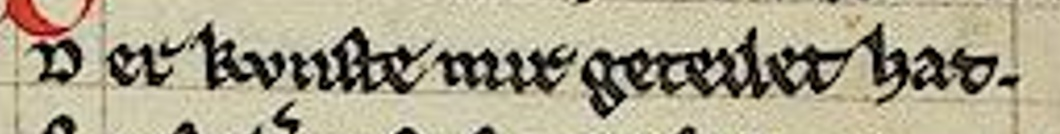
Der kvnſte mir geteilet hat.
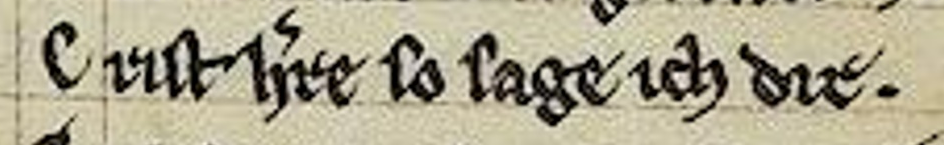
Criſt h(er)re ſo ſage ich dir.
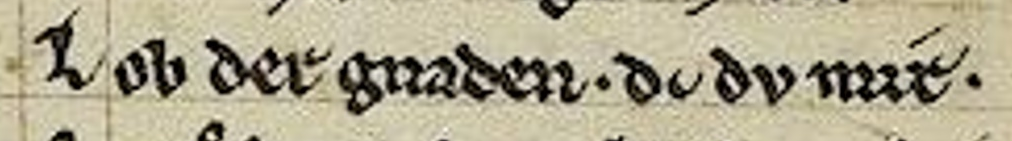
Lob der gnaden. d(az) dv mir.
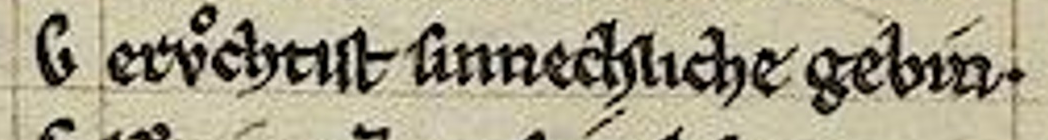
Gerv°ochtiſt ſinnechliche gebin.
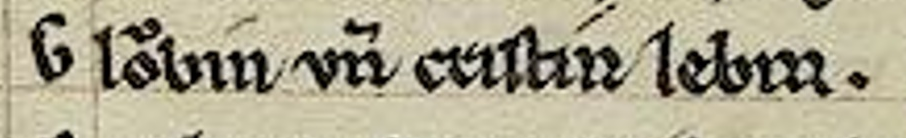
Glo°vbin vn(d) criſtin lebin.
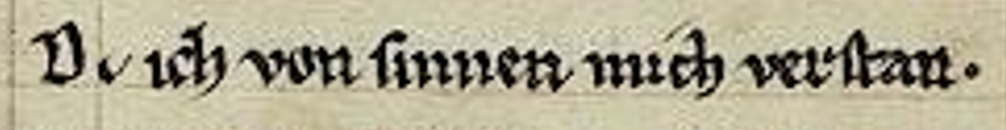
D(az) ich von ſinnen mich verſtan.
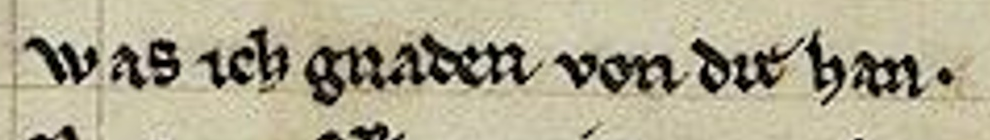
Was ich gnaden von dir han.
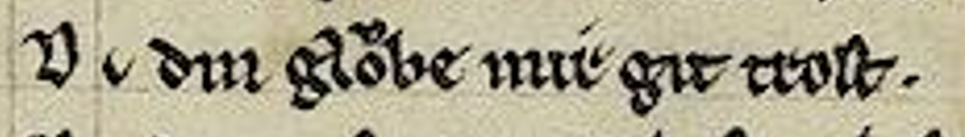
D(az) din glo°vbe mir git troſt.
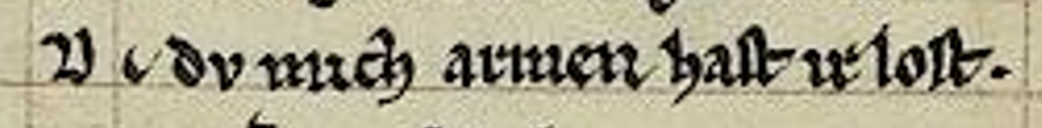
D(az) dv mich armen haſt ir loſt.
